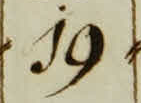19
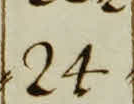24
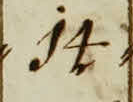14
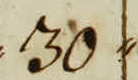30
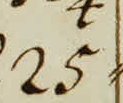25
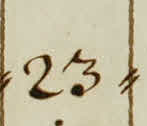23
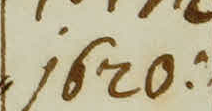1620
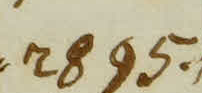2895
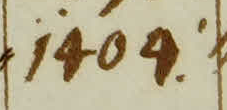1404.
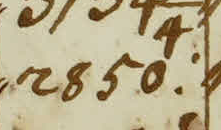2850.
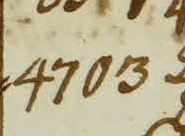4703
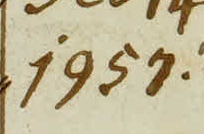1957
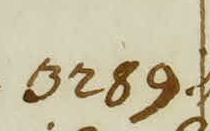3289
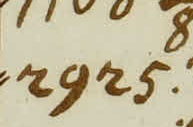2925
